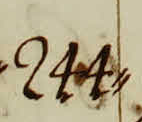244
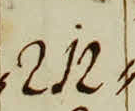212
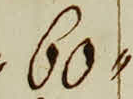60
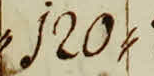120
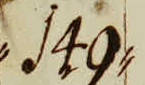149
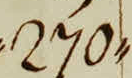270
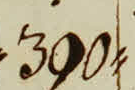390
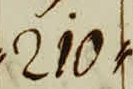210
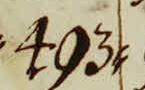493
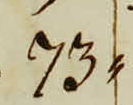73
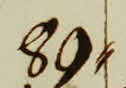89
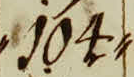104
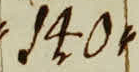140
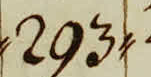293
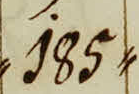185
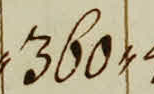360
